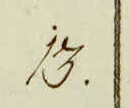13.
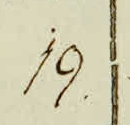19.
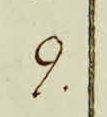9.
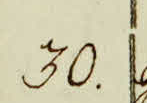30.
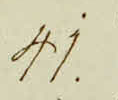41.
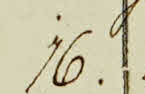16.
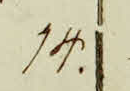14.
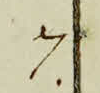7.
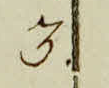3.
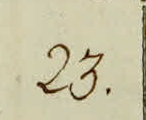23.
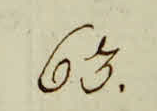63.
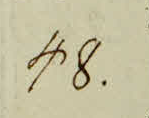48.
